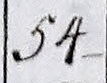54
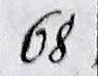68
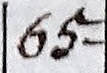65
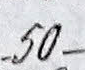50
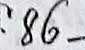86
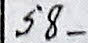58
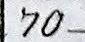70
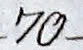70
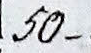50
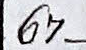67
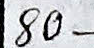80
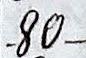80
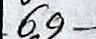69
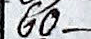60
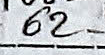62
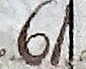61
